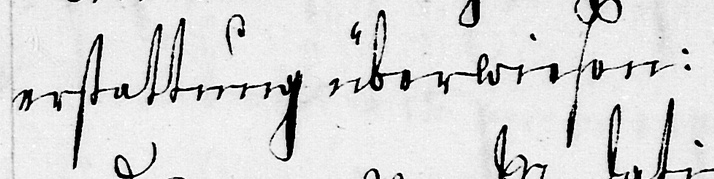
erstattung überwiesen:
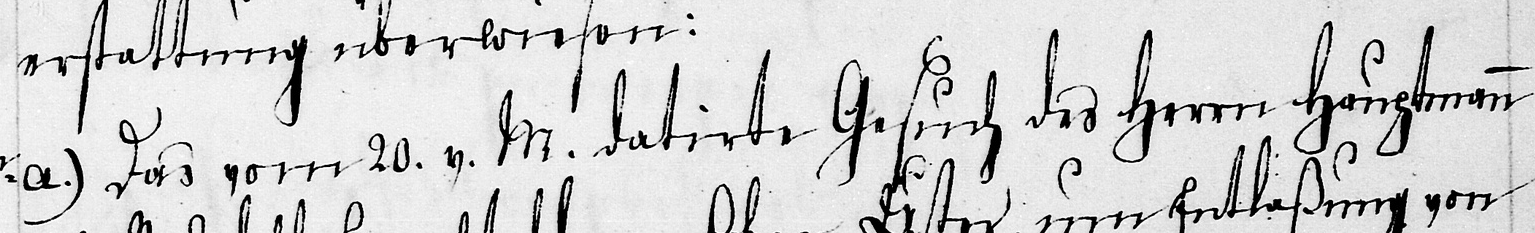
b.) Das vom 8. d. M. datirte Gesuch des Herrn Hauptmann
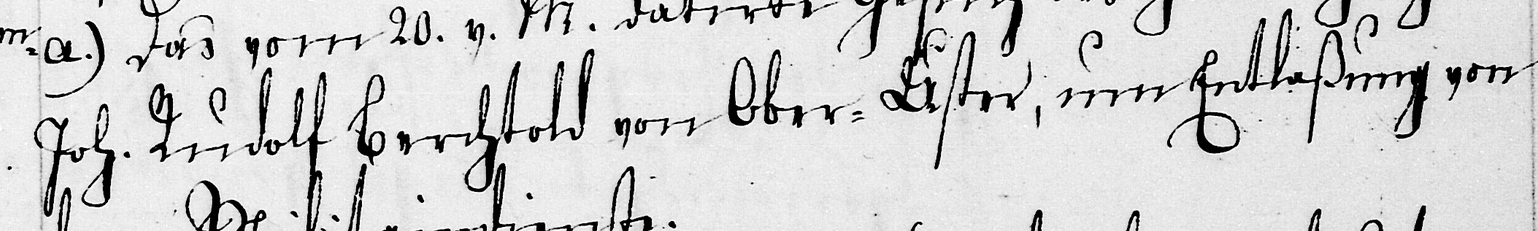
Joh. Rudolf Berchtold von Ober-Uster, um Entlaßung von
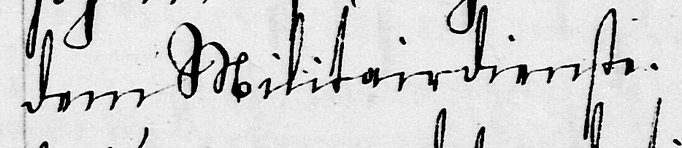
dem Militairdienste.
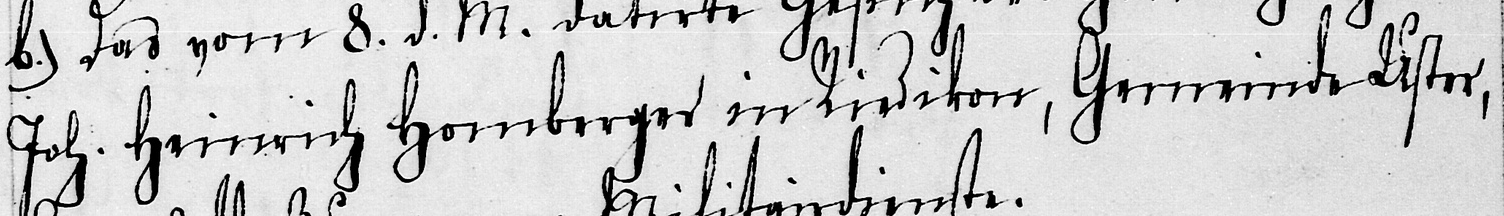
Joh. Heinrich Homberger in Riedikon, Gemeinde Uster,
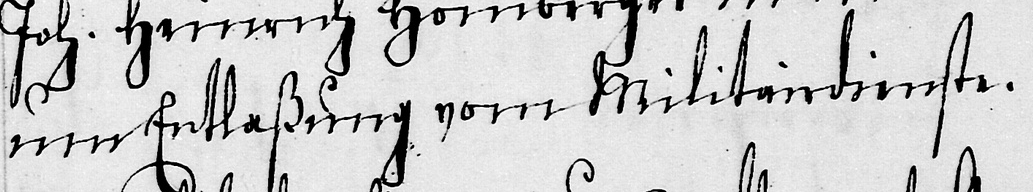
um Entlaßung vom Militairdienste.
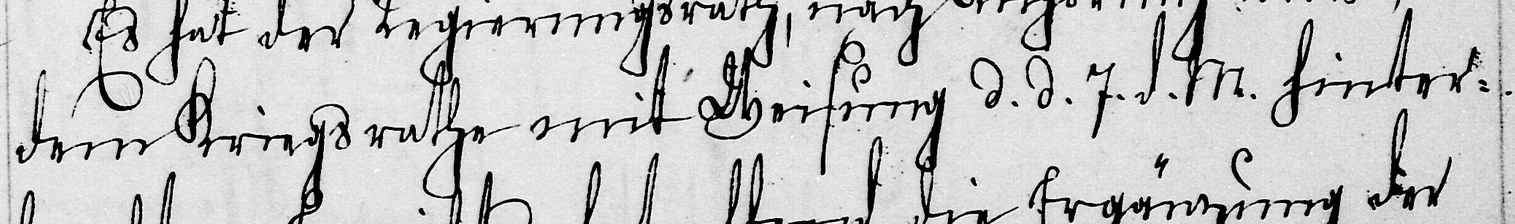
dem Kriegsrathe mit Weisung d. d. 7. d. M. hinter¬
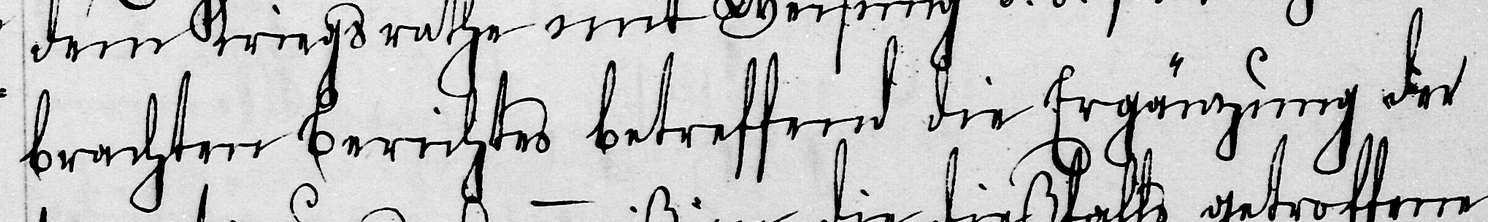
brachten Berichtes betreffend die Ergänzung der
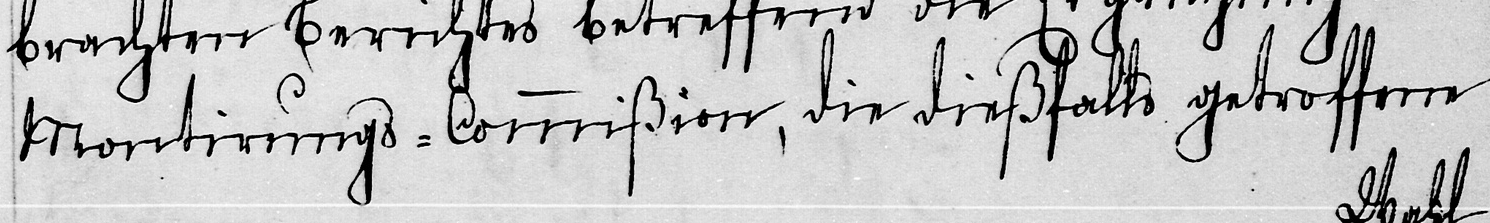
Montirungs-Commißion, die dießfalls getroffene
